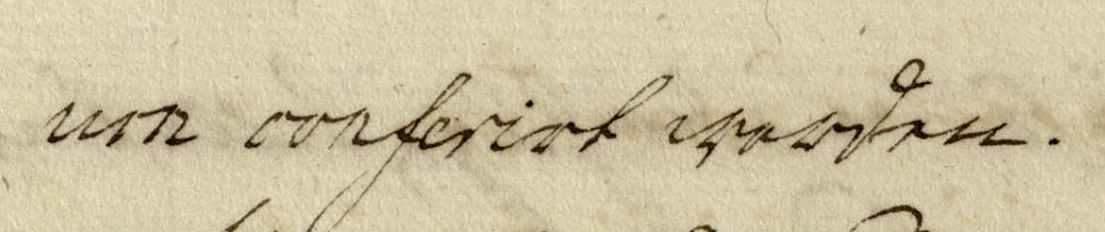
um conferirt werden.
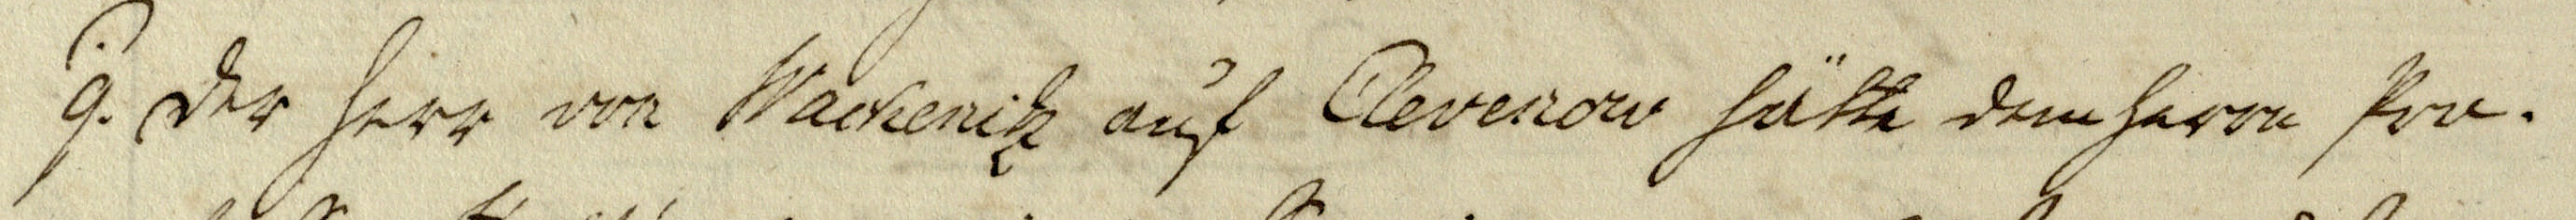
9. Der Herr von Wackenitz auf Clevenow hätte dem Herrn Pro¬
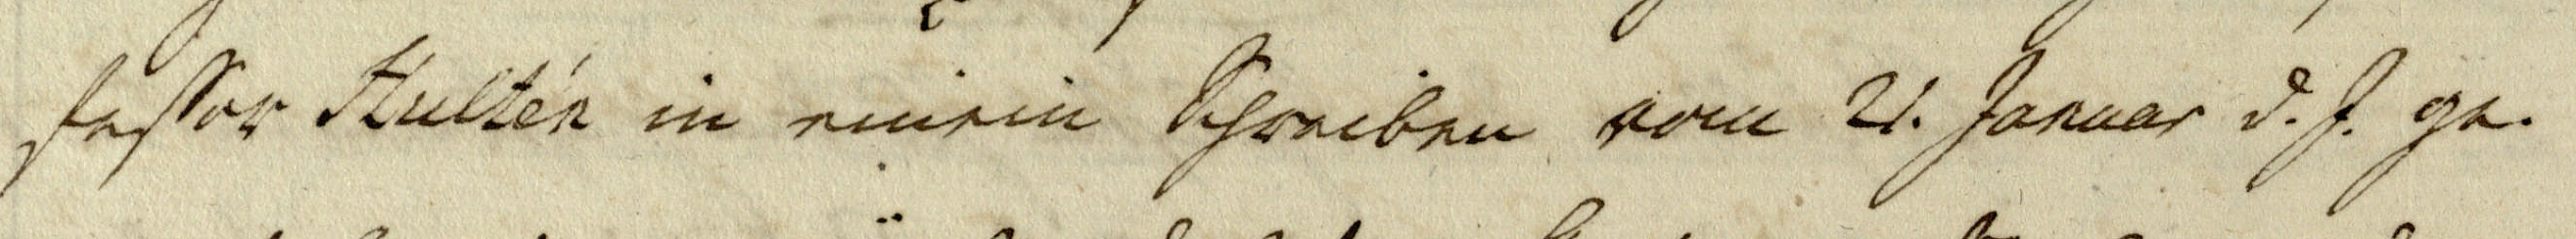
fessor Hultén in einem Schreiben vom 21. Januar d. J. ge¬
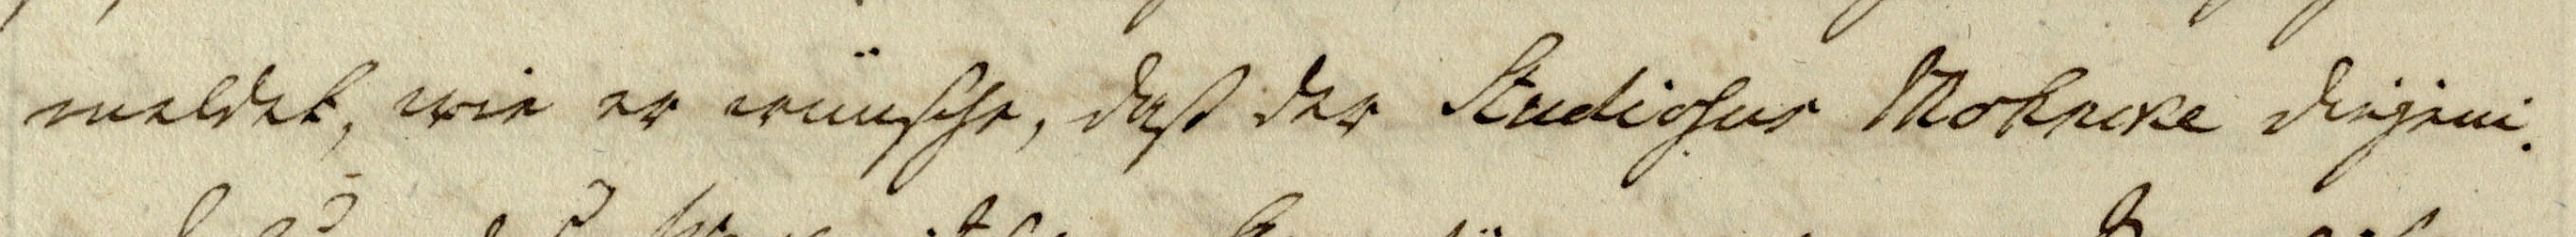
meldet, wie er wünsche, daß der Studiosus Mohncke diejeni¬
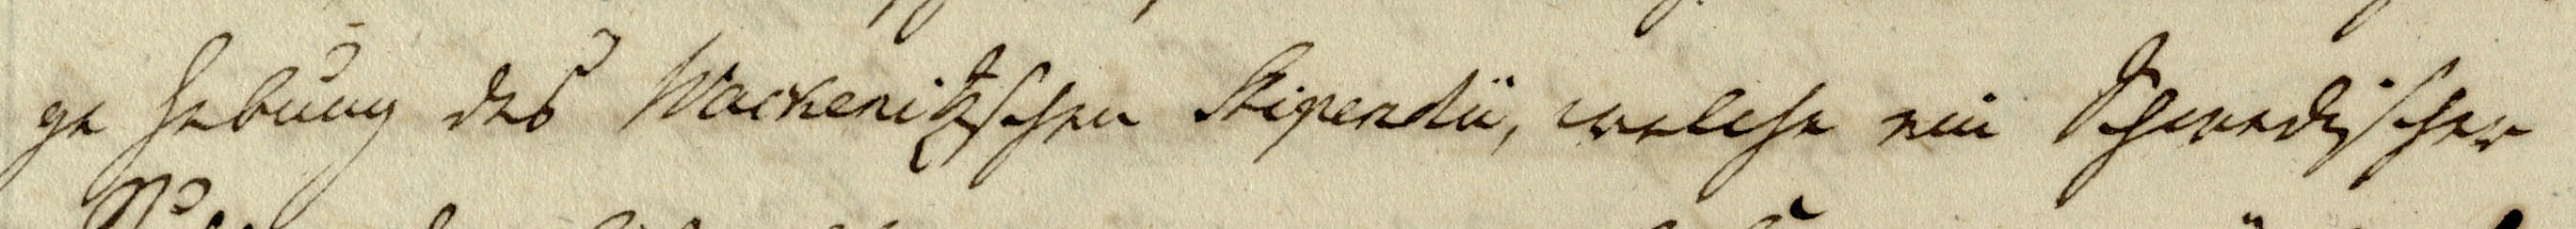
ge Hebung des Wackenitzschen Stipendii, welche ein Schwedischer
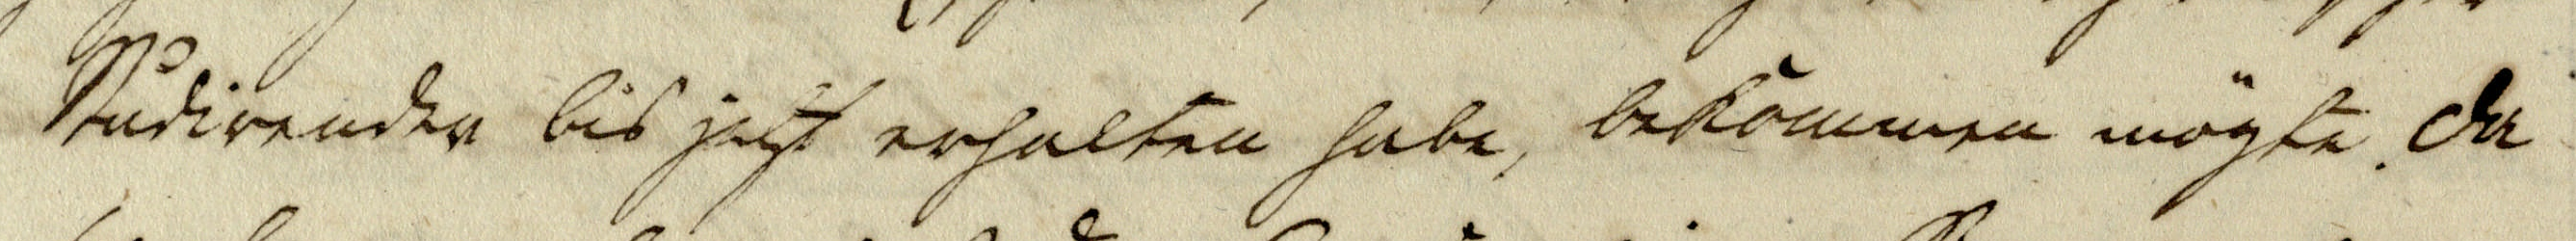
Studirender bis jetzt erhalten habe, bekommen mögte. Da
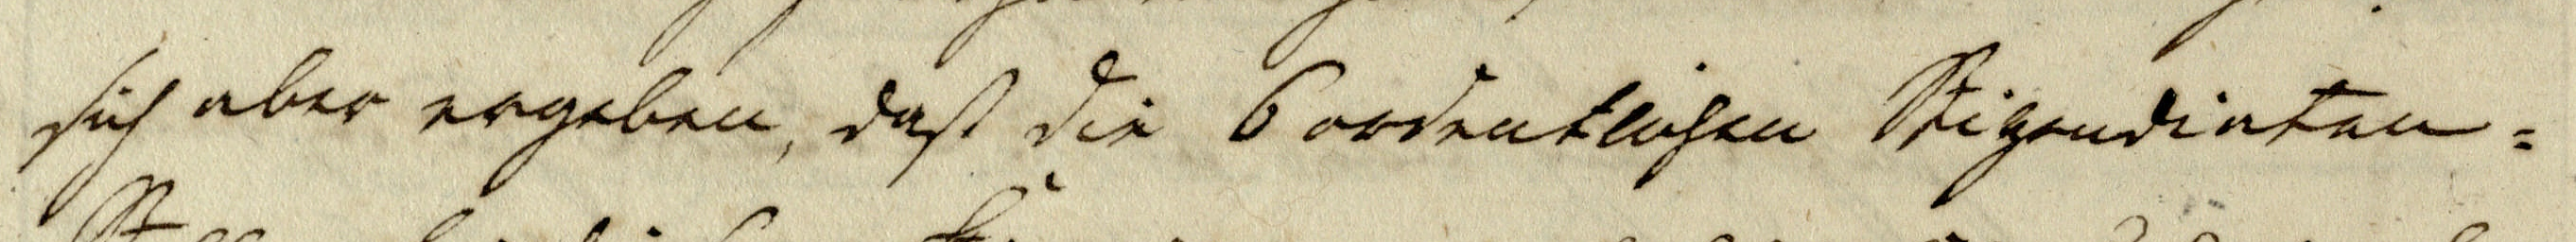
sich aber ergeben, daß die 6 ordentlichen Stipendiaten¬
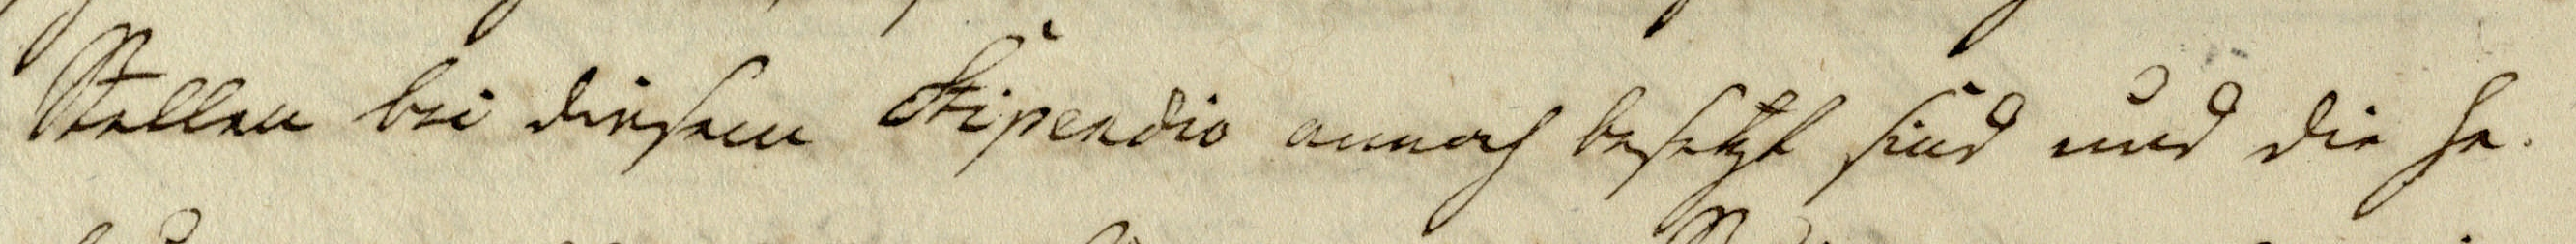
Stellen bei diesem Stipendio annoch besetzt sind und die He¬
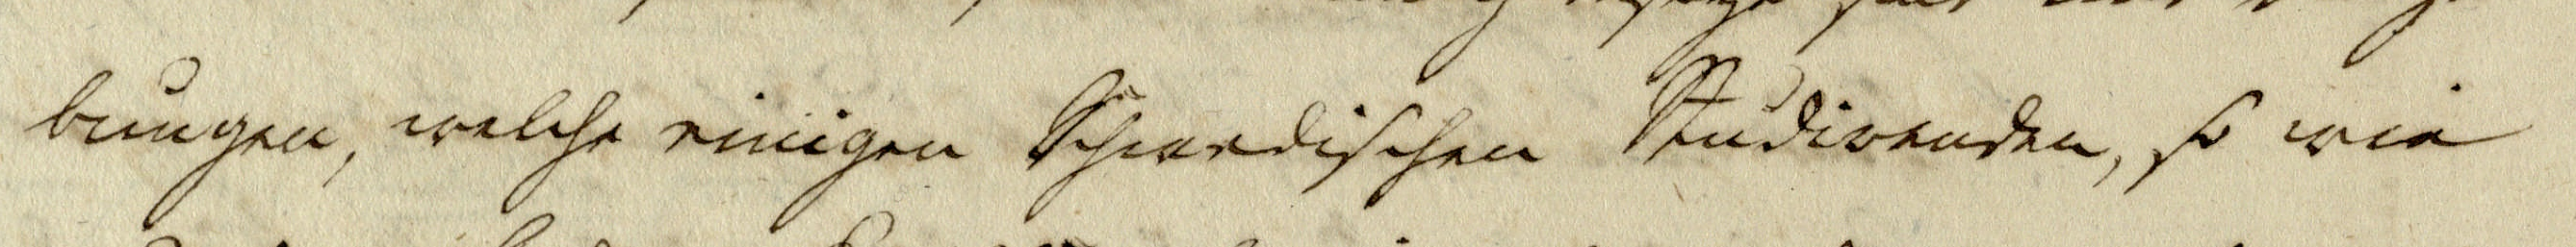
bungen, welche einigen Schwedischen Studirenden, so wie
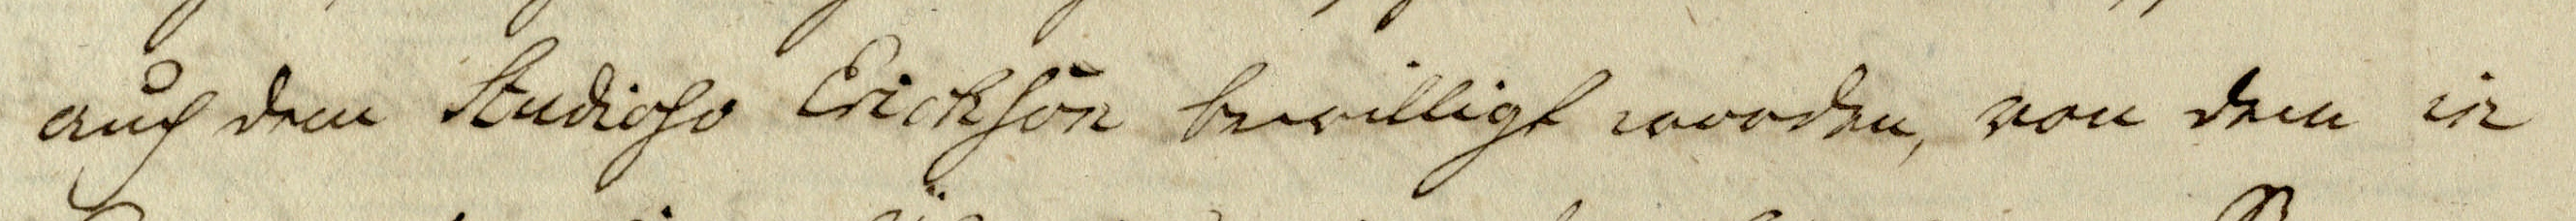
auch dem Studioso Erichson bewilligt worden, von dem in
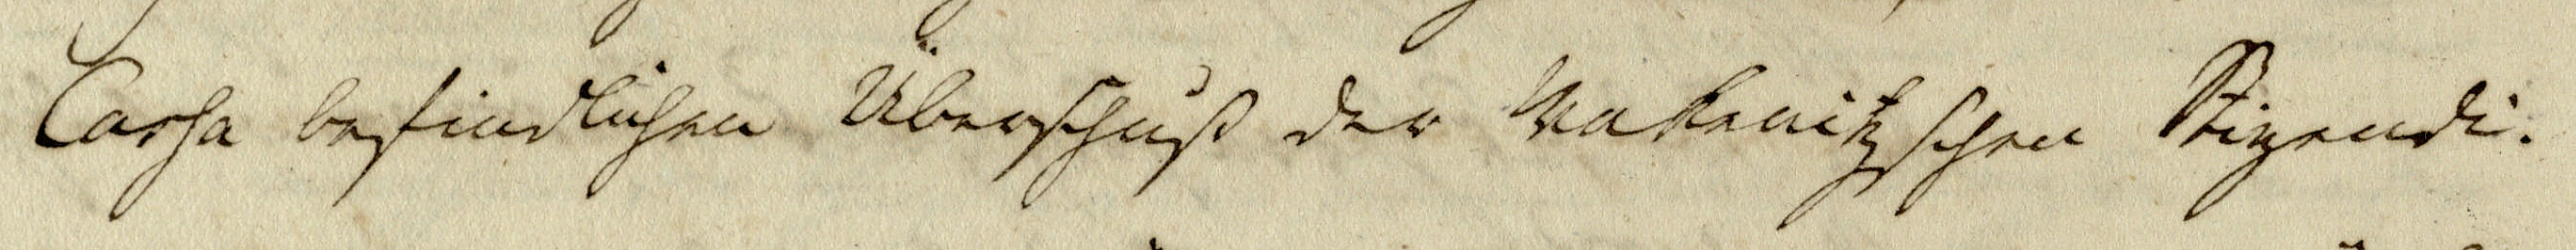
Cassa befindlichen. Überschuß der Waknitzschen Stipendi¬
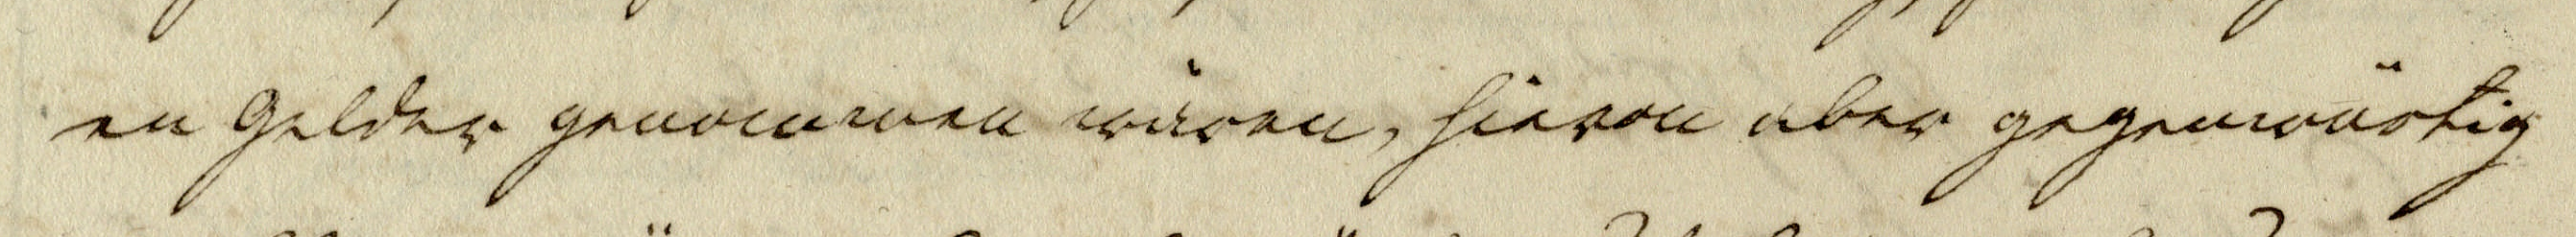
en Gelder genommen wären, hievon aber gegenwärtig
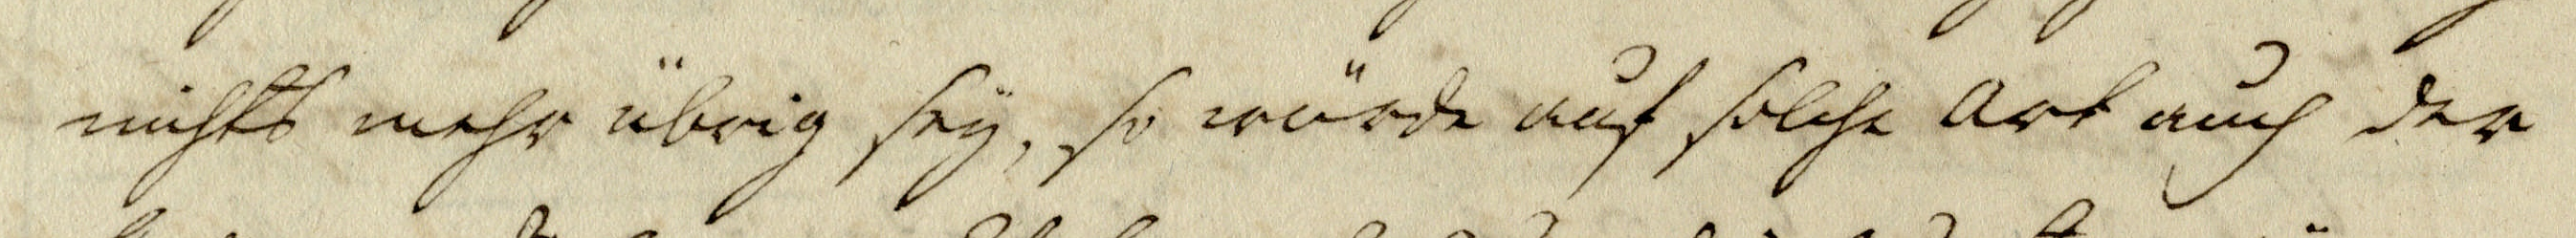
nichts mehr übrig seÿ, so würde auf solche Art auch der
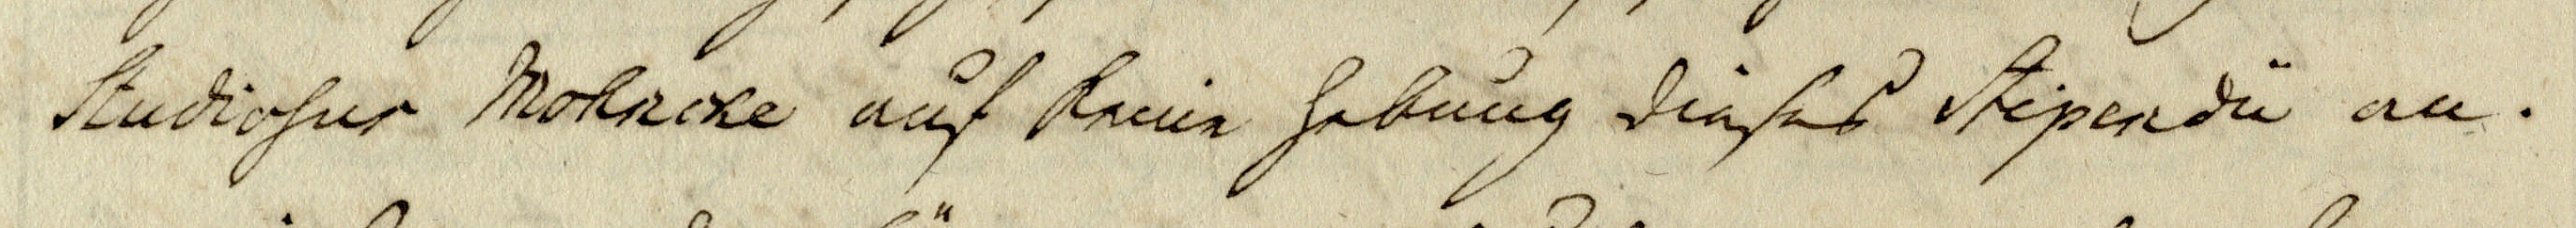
Studiosus Mohncke auf keine Hebung dieses Stipendii an¬
